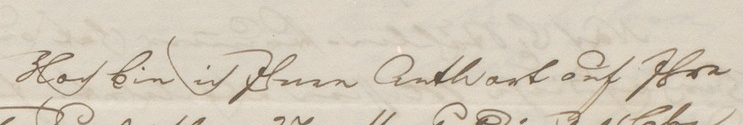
Noch bin ich Ihnen Antwort auf Ihre
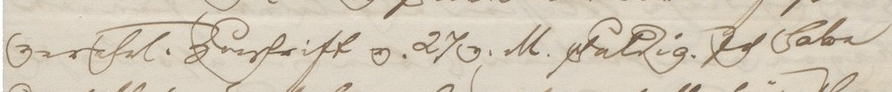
verehrl. Zuschrift v. 27 v. M. schuldig. Ich habe
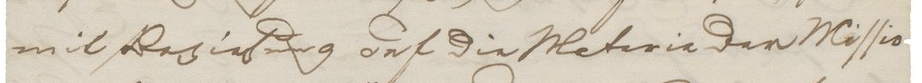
mit Beziehung auf die Materie der Missio-
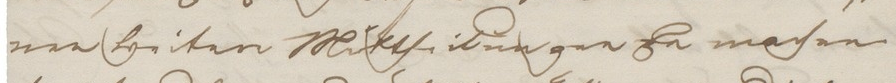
nen weitere Mittheilungen zu machen.
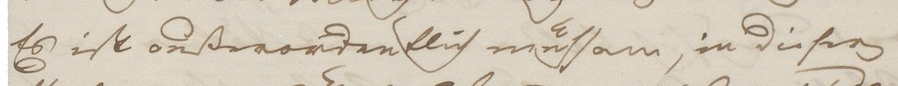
Es ist außerordentlich mühsam, in dieser
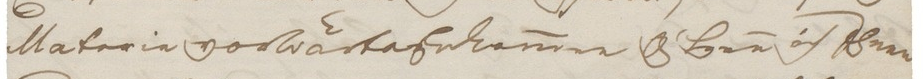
Materie vorwärtszukommen & wenn ich Ihnen
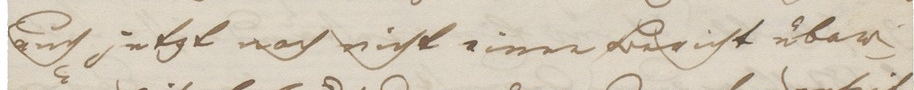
auch jetzt noch nicht einen Bericht über
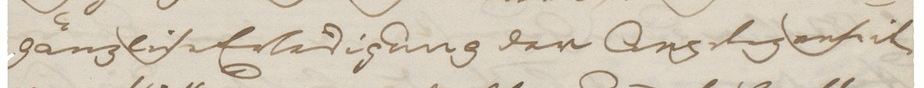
gänzliche Erledigung der Angelegenheit
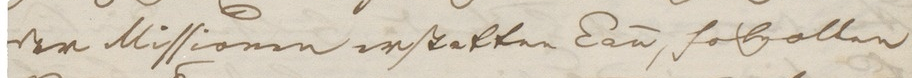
der Missionen erstatten kann, so wollen
